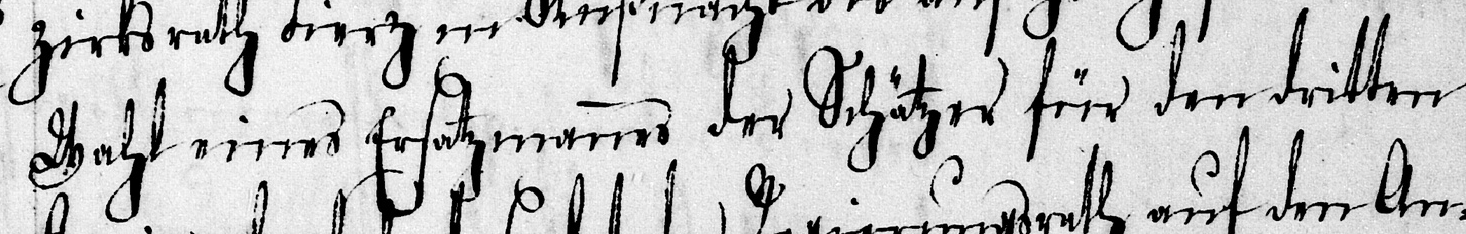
Wahl eines Ersatzmannes der Schätzer für den dritten
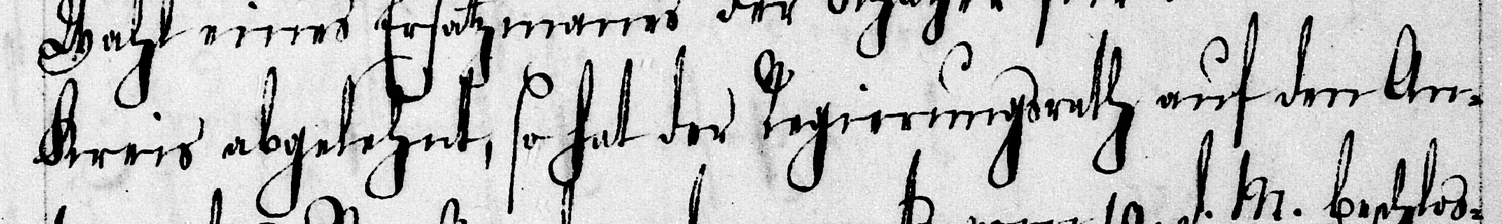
Kreis abgelehnt, so hat der Regierungsrath auf den An¬
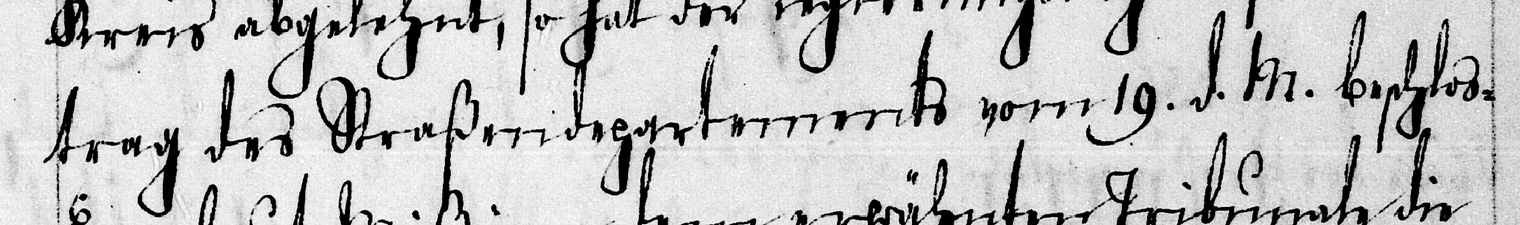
trag des Straßendepartements vom 19. d. M. d beschloß¬
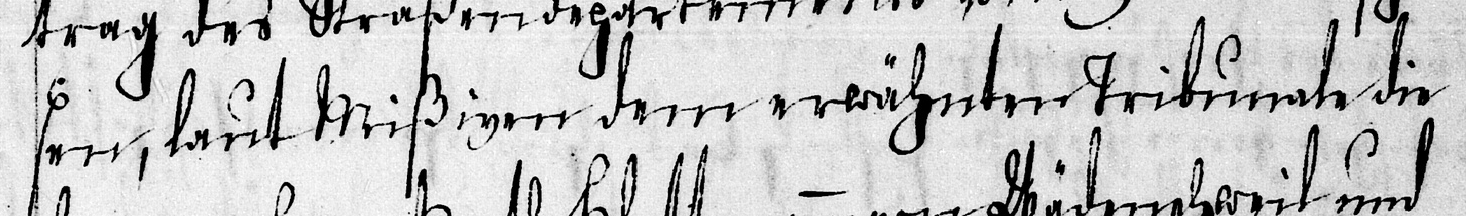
en, laut Mißiven dem erwähnten Tribunale die
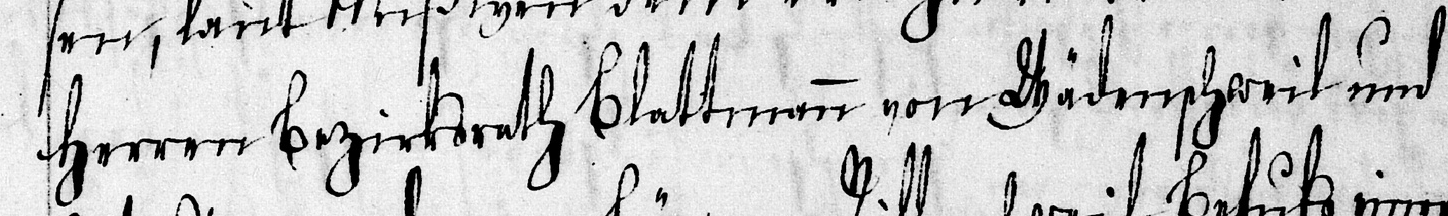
Herren Bezirksrath Blattmann von Wädenschweil und
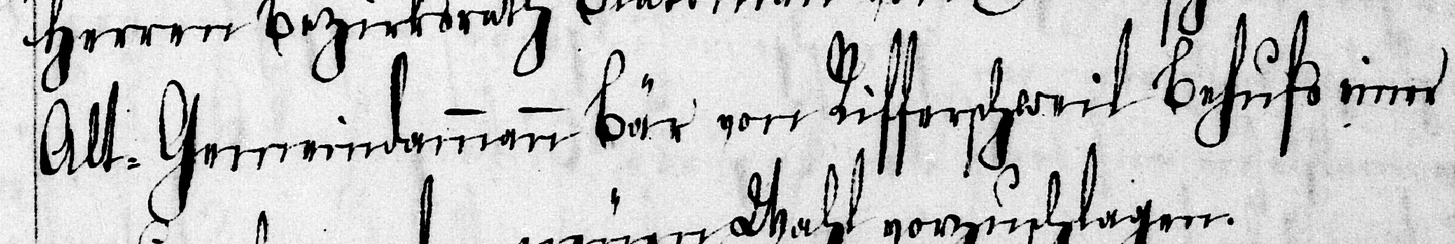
Alt-Gemeindammann Bär von Rifferschweil Behufs einer
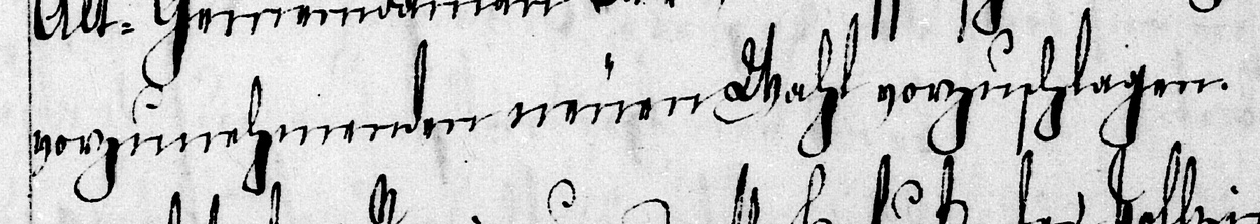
vorzunehmenden neuen Wahl vorzuschlagen.
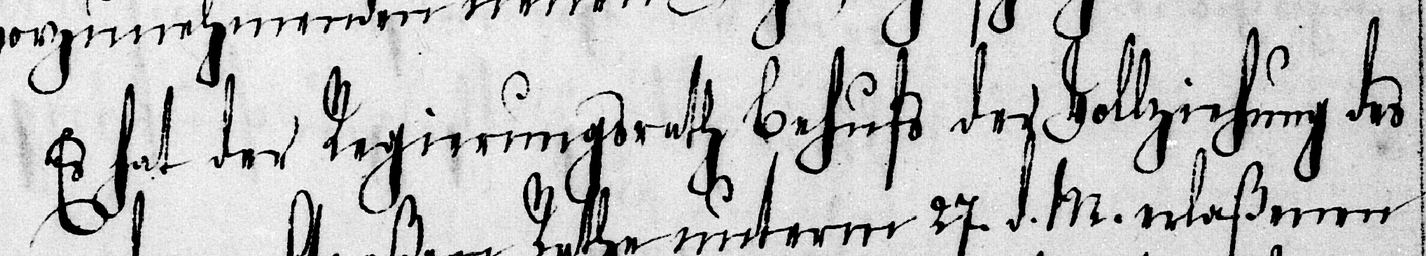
Es hat der Regierungsrath Behufs der Vollziehung d¬
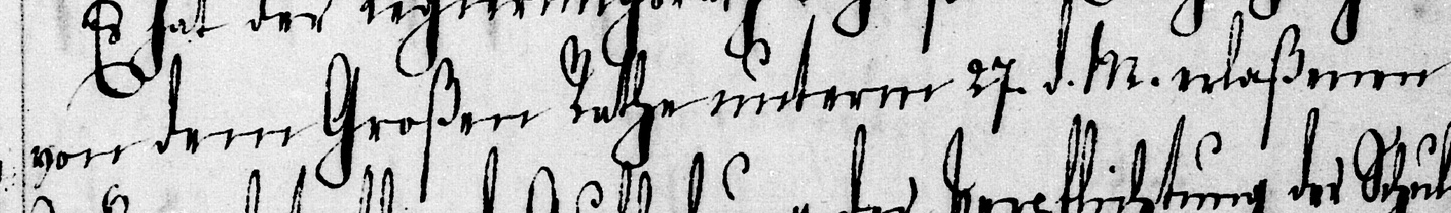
von dem Großen Rathe unterm 27. d. M. erlaßenen
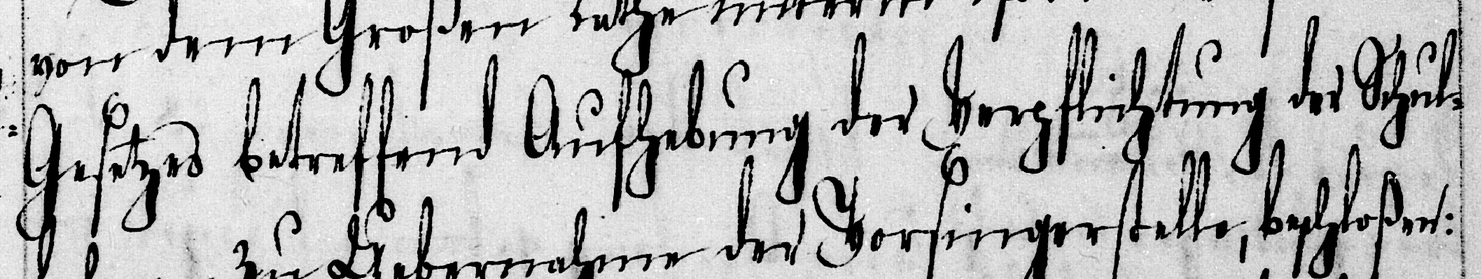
setzes betreffend Aufhebung der Verpflichtung der Sc¬
